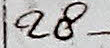28
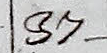37
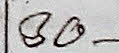30
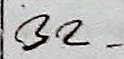32
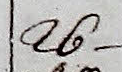26
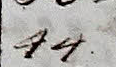44
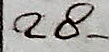28
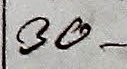30
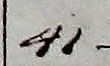41
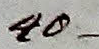40
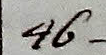46
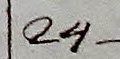24
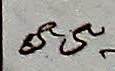55
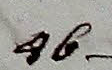46
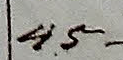45
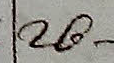26
